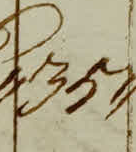35
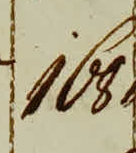168
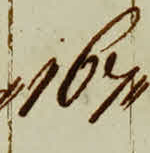167
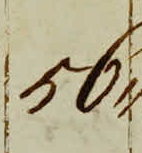56
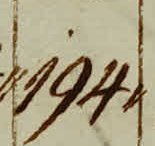194
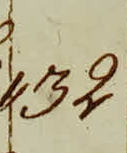32
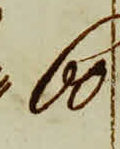60
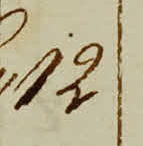12
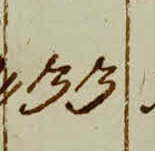33
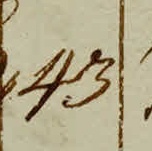43
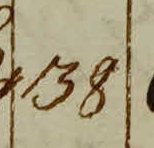38
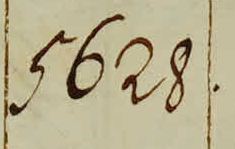5628
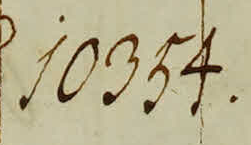10354
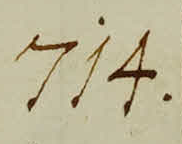714
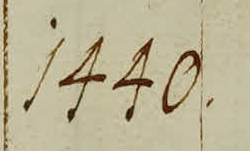1440.
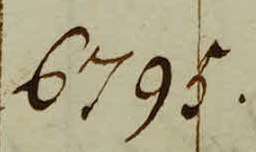6795
